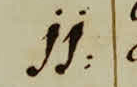11:
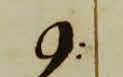9:
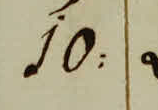10:
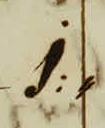1:
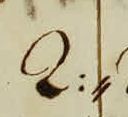2:
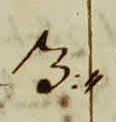3:
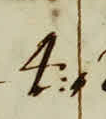4:
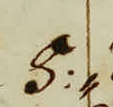5:
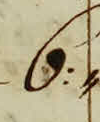6:
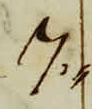7
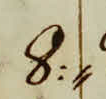8:
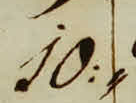10:
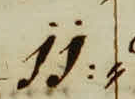11:
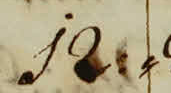12:
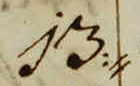13:
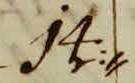14:
